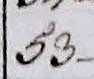53
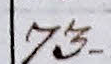73
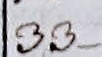33
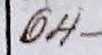64
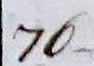76
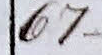67
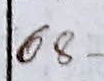68
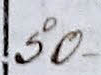50
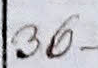36
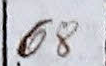68
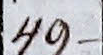49
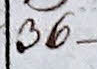36
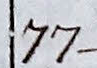77
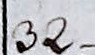32
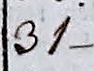31
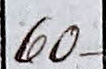60
